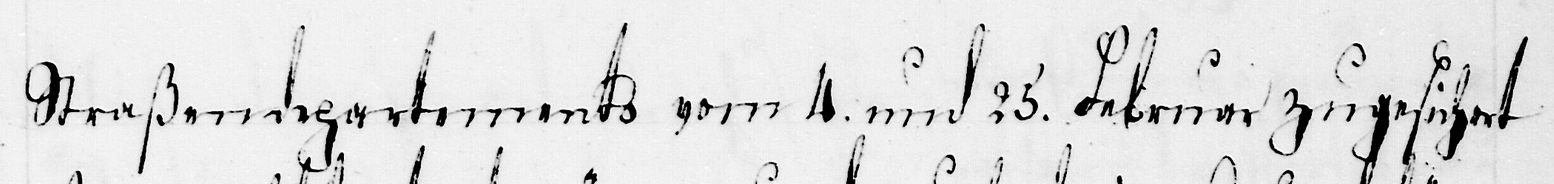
Straßendepartements vom 4. und 25. Februar zugesichert
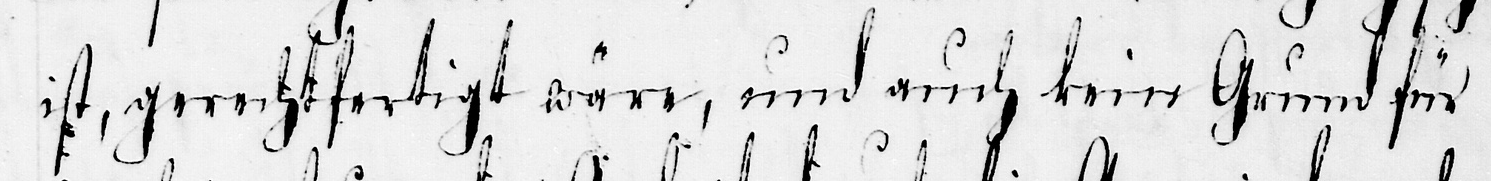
ist, gerechtfertigt wäre, und auch kein Grund für
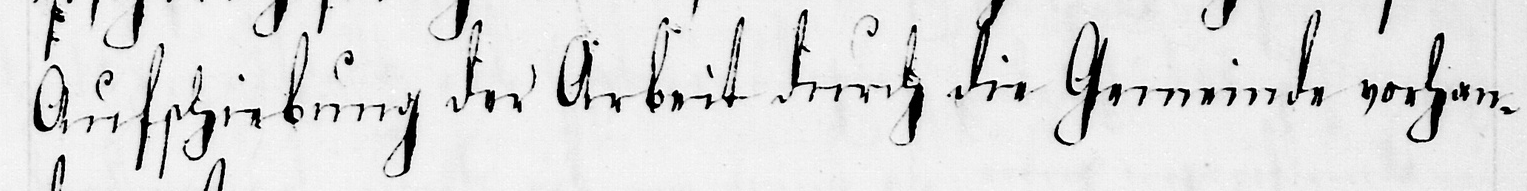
Aufschiebung der Arbeit durch die Gemeinde vorhan¬
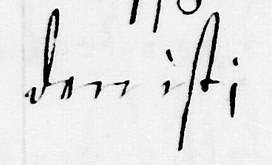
den ist;
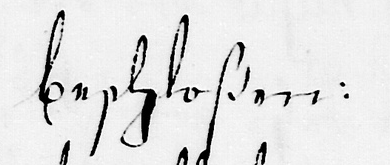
beschloßen:
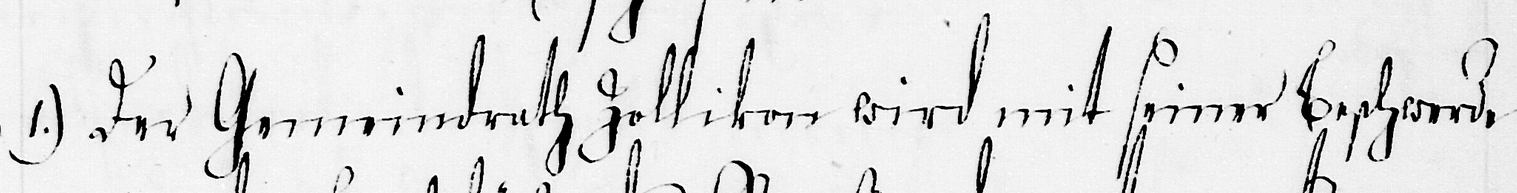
1.) Der Gemeindrath Zollikon wird mit seiner Beschwerde
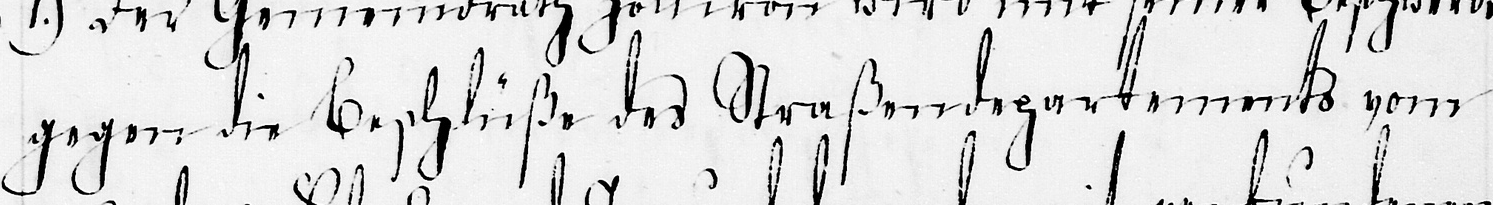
gegen die Beschlüße des Straßendepartements vom
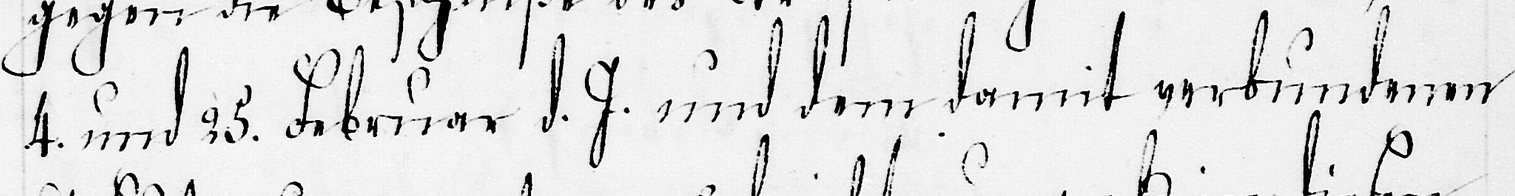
4. und 25. Februar d. J. und dem damit verbundenen
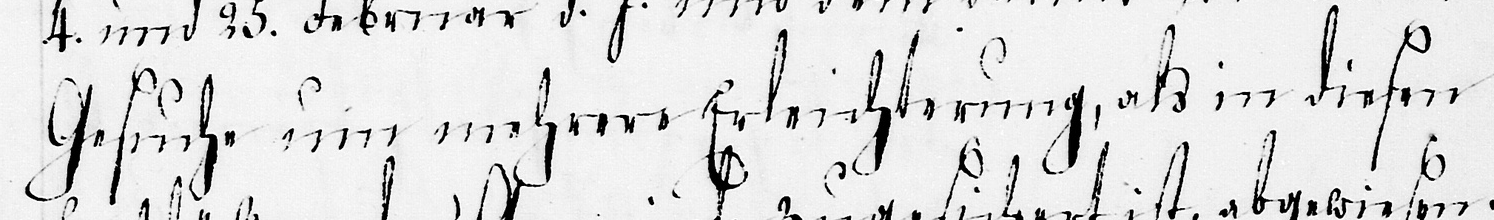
Gesuche um mehrere Erleichterung, als in diesen
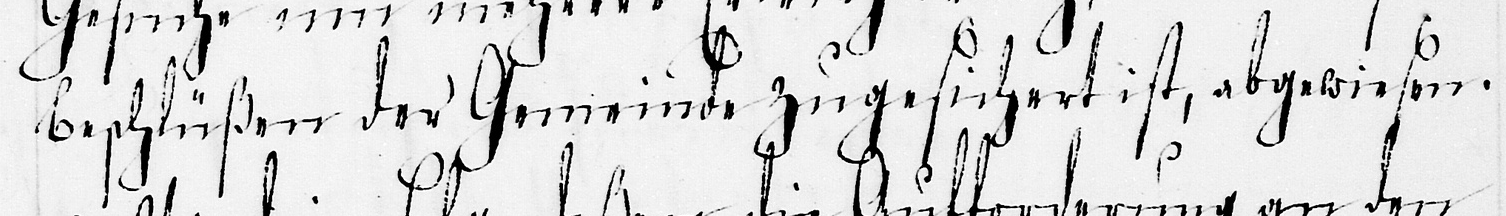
Beschlüßen der Gemeinde zugesichert ist, abgewiesen.
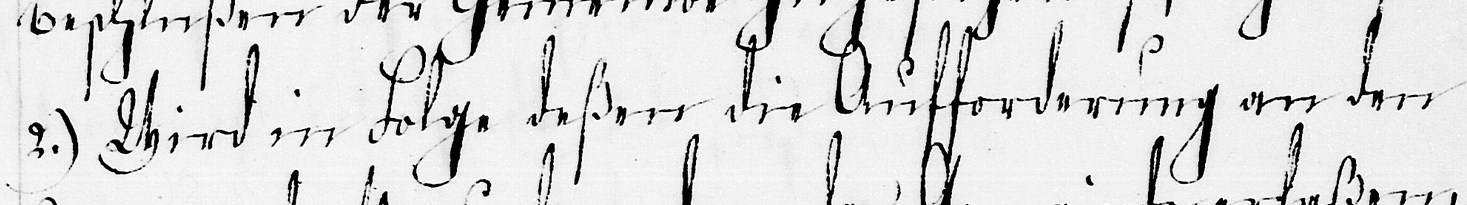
2.) Wird in Folge deßen die Aufforderung an den
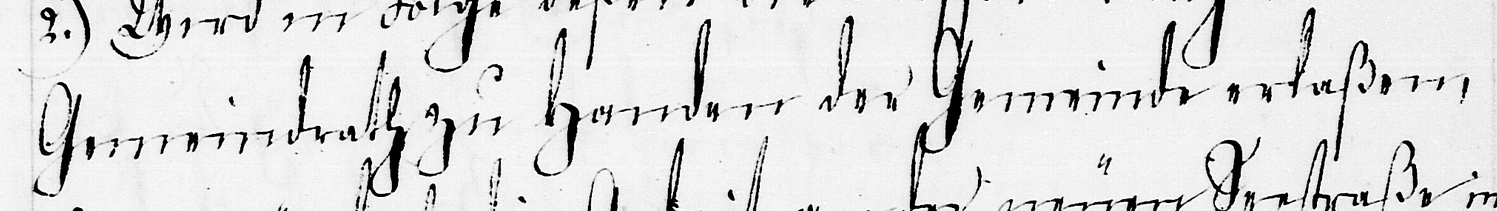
Gemeindrath zu Handen der Gemeinde erlaßen,
